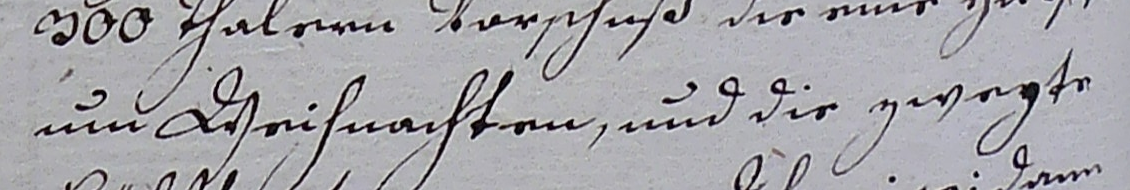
um Weihnachten, und die zweyte
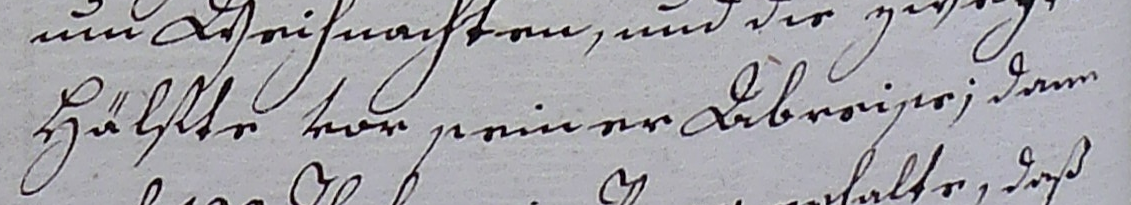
Hälfte vor seiner Abreise; dann
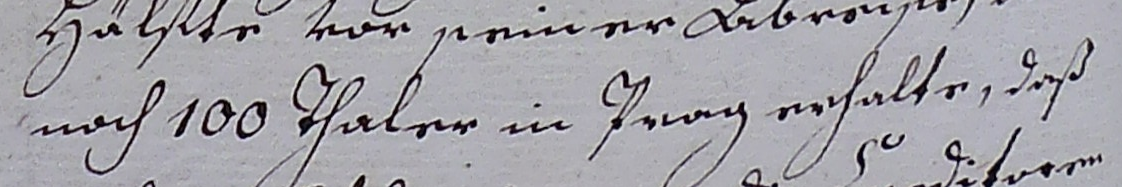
nach 100 Thaler in Prag erhalte, daß
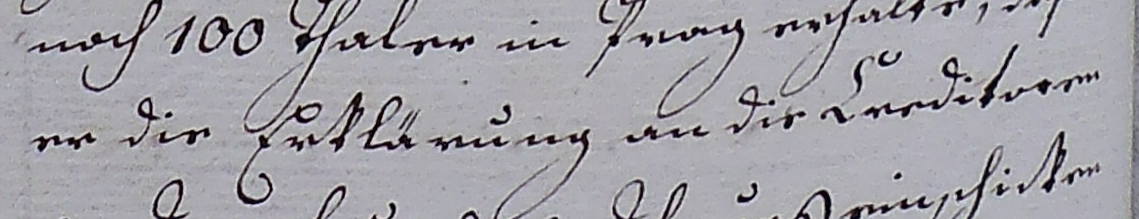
er die Erklärung an die Creditoren
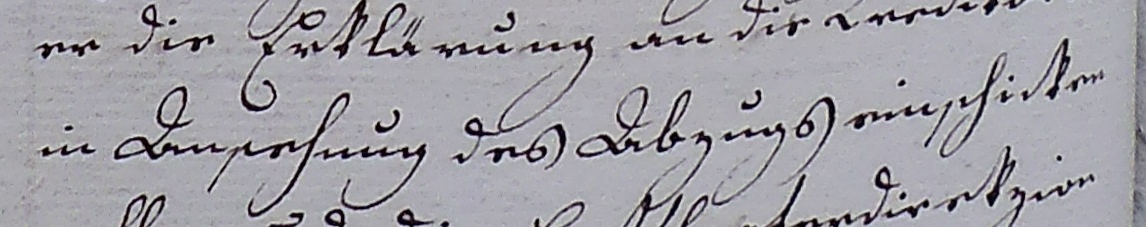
in Ansehung des Abzugs einschicken
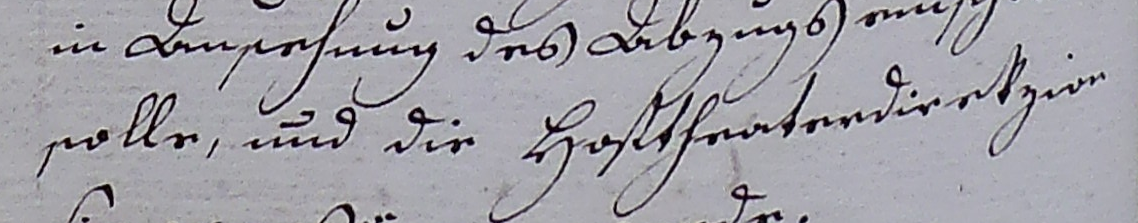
solle, und die Hoftheaterdirekzion
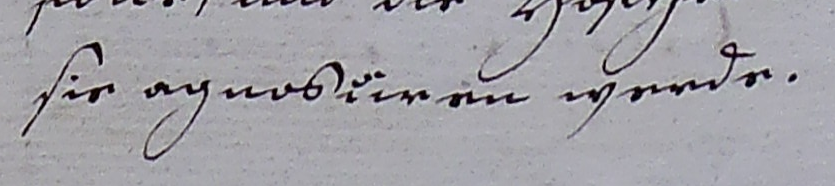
sie agnosciren werde.
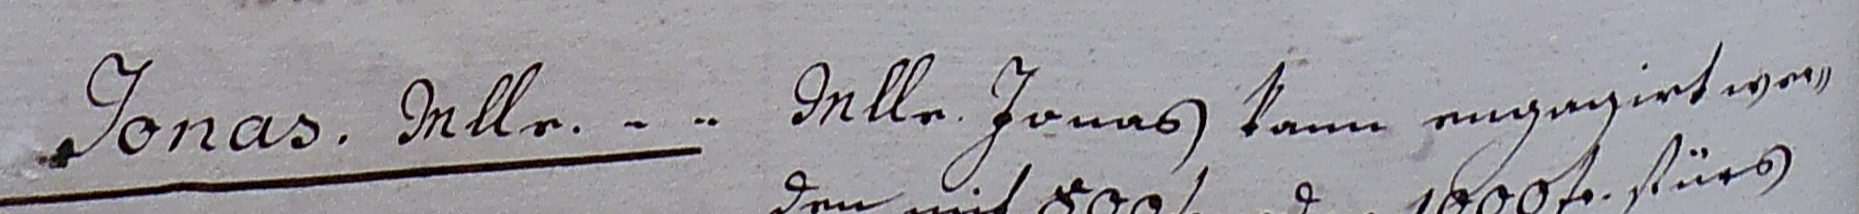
Jonas. Mllle. .. .. Mlle Jonas kann engagirt wer¬
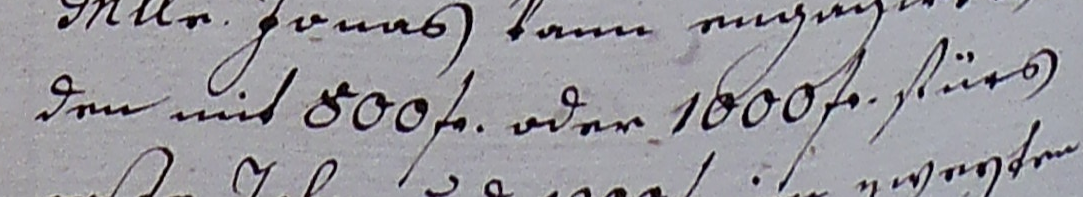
den mit 800fr. oder 1000fr. fürs
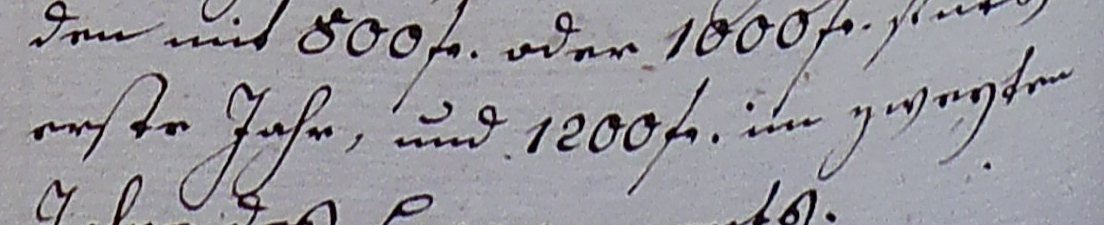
erste Jahr, und 1200fr. im zweyten
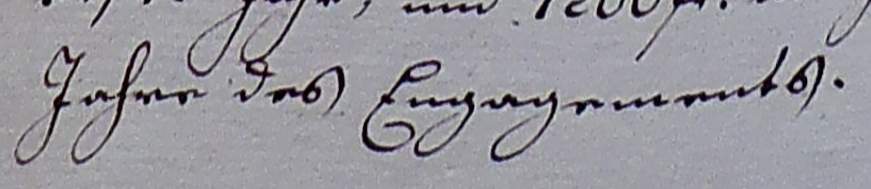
Jahre des Engagements.
